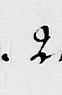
2.
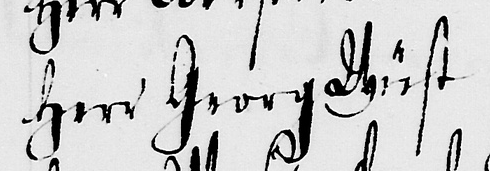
Herr Georg Wüst
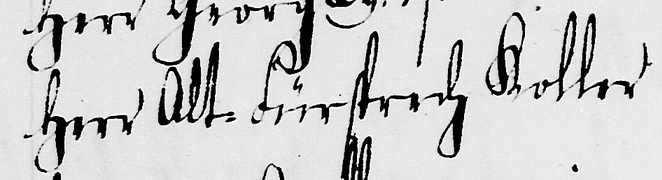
Herr Alt-Fürsprech Koller
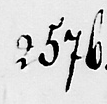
2576.
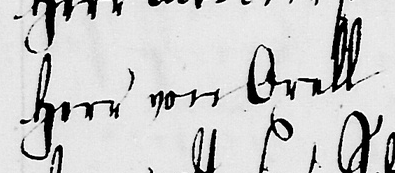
Herr von Orell
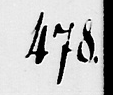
478.
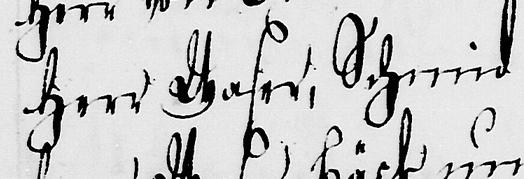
Herr Waser, Schmid
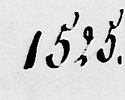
1525.
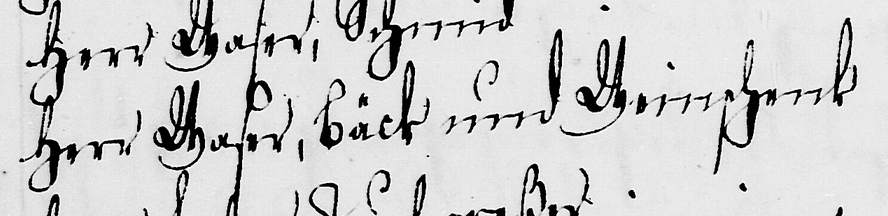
Herr Waser, Bäck und Weinschenk
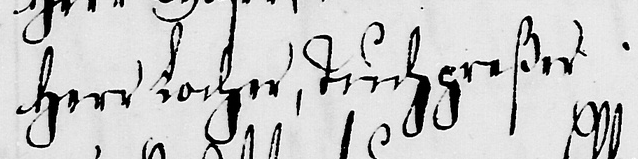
Herr Locher, Tuchpresser
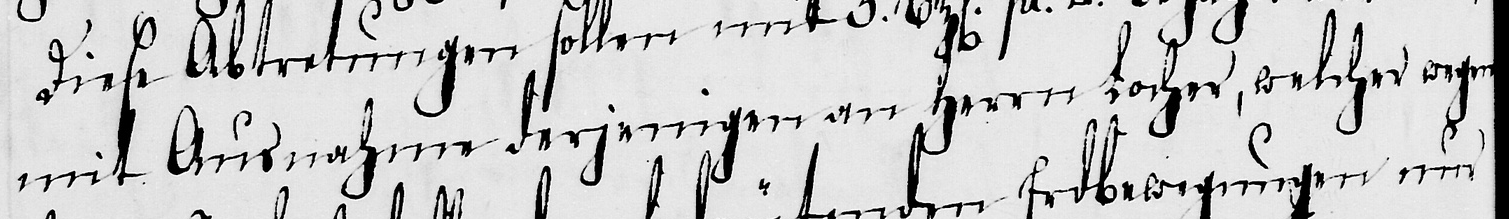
mit Ausnahme derjenigen an Herrn Locher, welcher wegen
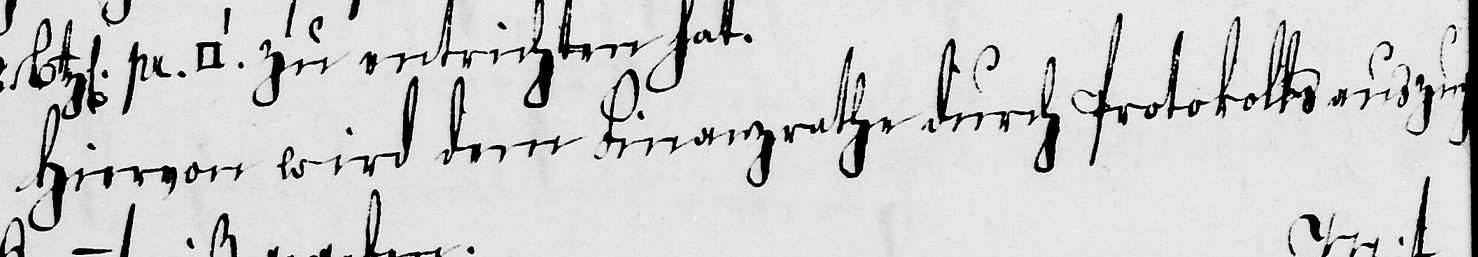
Hiervon wird dem Finanzrathe durch Protokollsauszug
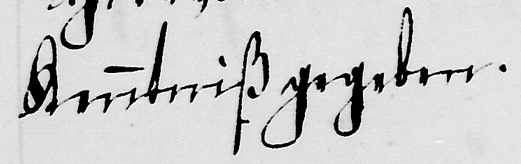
Kenntniß gegeben.
